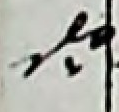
do
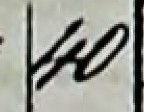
40
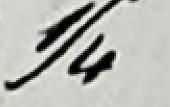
1/4
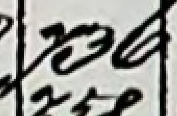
736
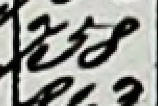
758
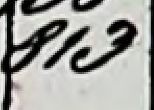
813
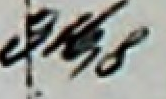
316,8
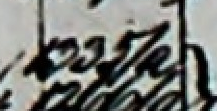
1335/a
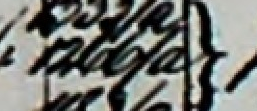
1266/a
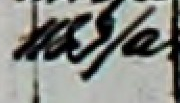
1183/a
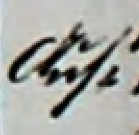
Aus„
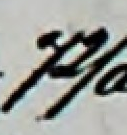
72/a
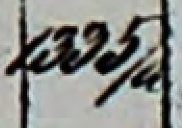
1335/a
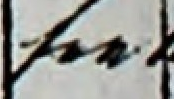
see
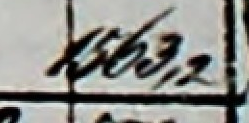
1563,2
